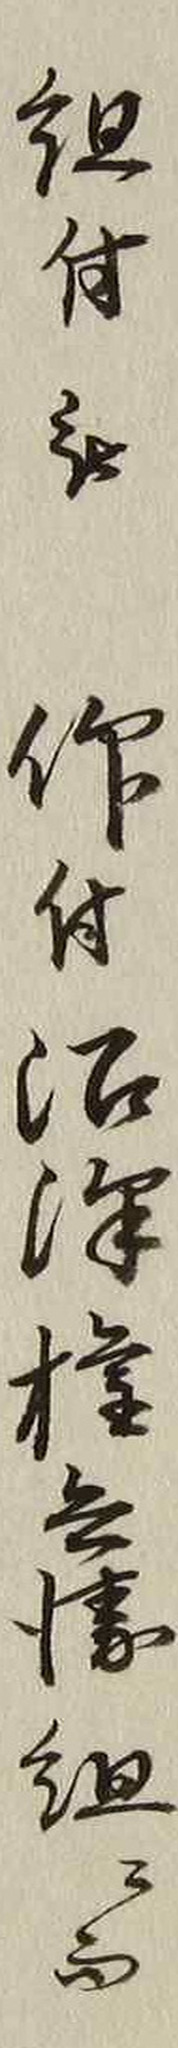組付被仰付沼沢権兵衛組ニ而
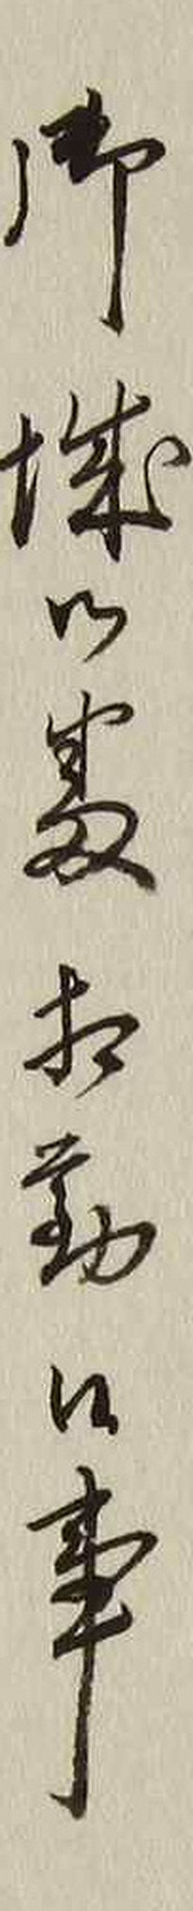御城御番相勤候事
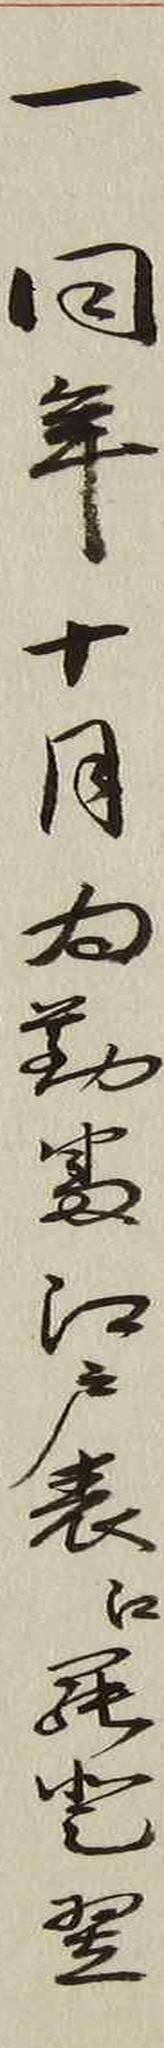一同年十月為勤番江戸表江罷登翌
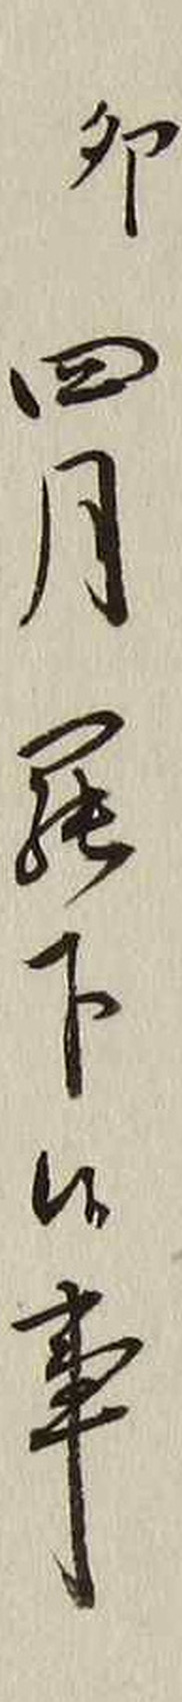卯四月罷下候事
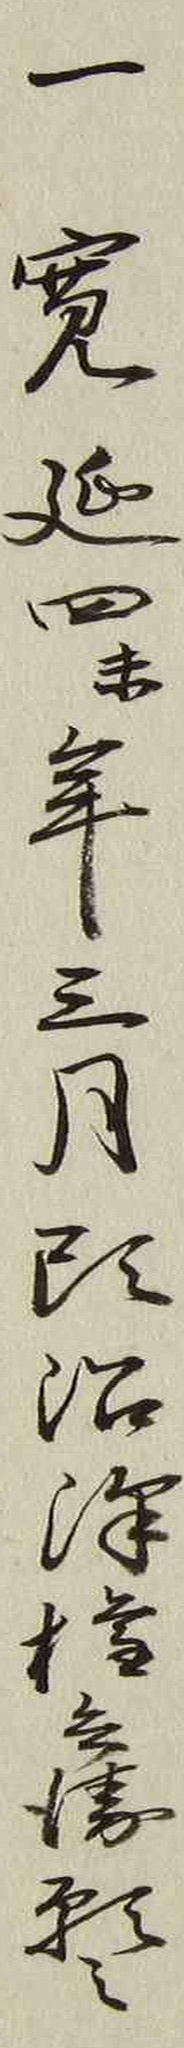一寛延四未年三月頭沼沢権兵衛願之
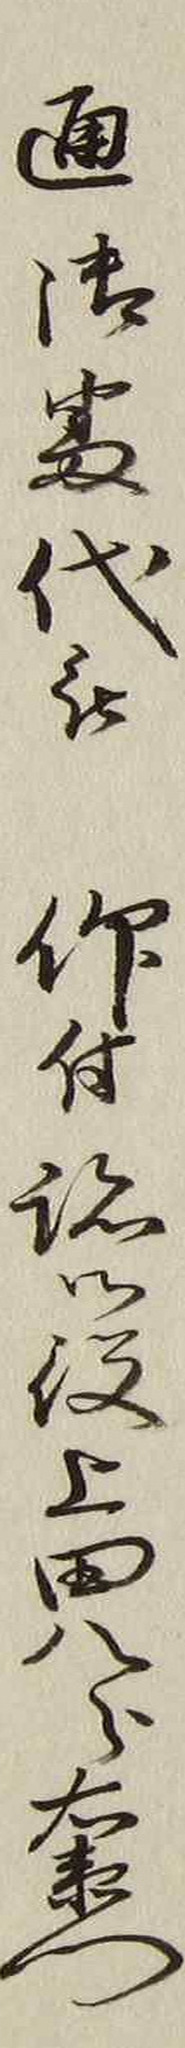通御番代被仰付跡御役上田八郎右衛門
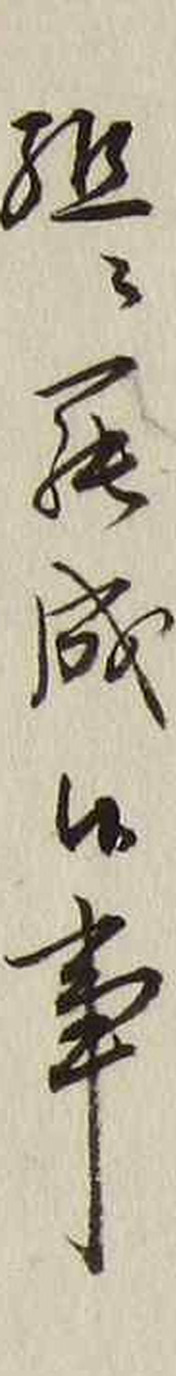組ニ罷成候事
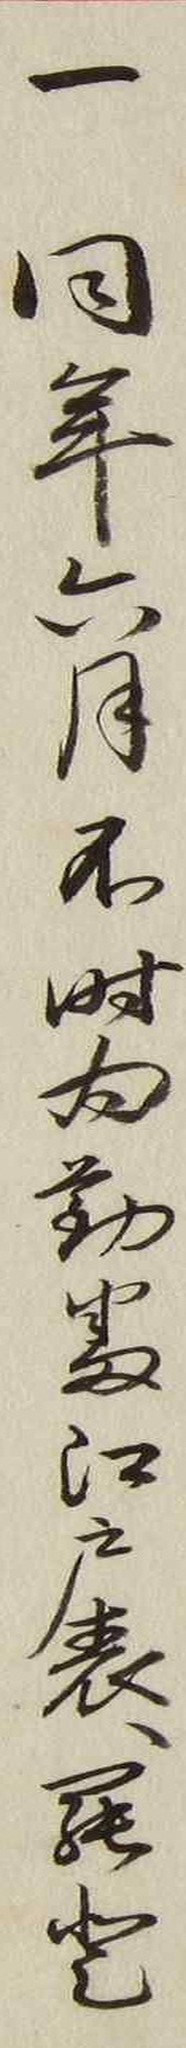一同年六月不時為勤番江戸表へ罷登

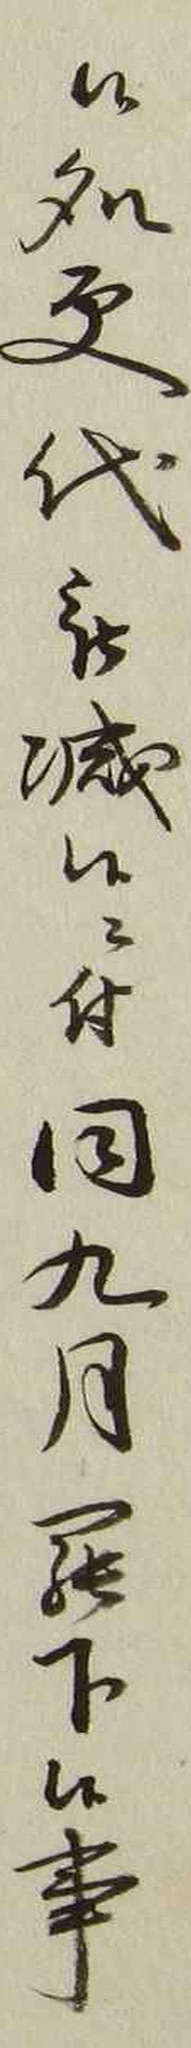候処更代被減候ニ付同九月罷下候事
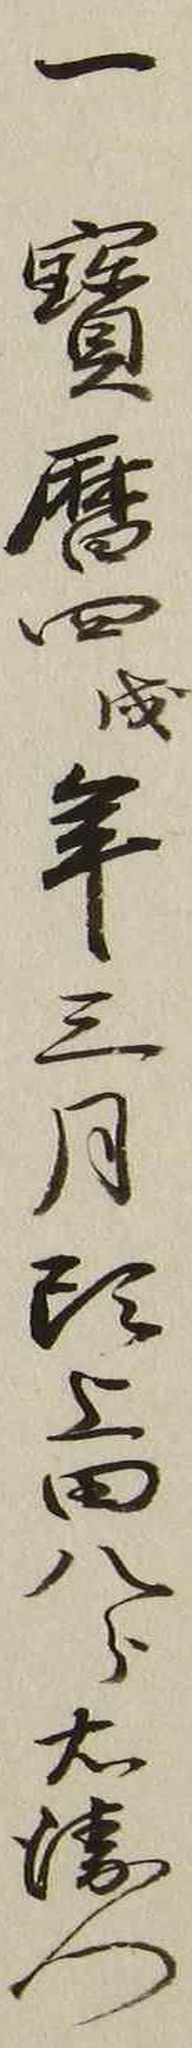一宝暦四戌年三月頭上田八郎右衛門
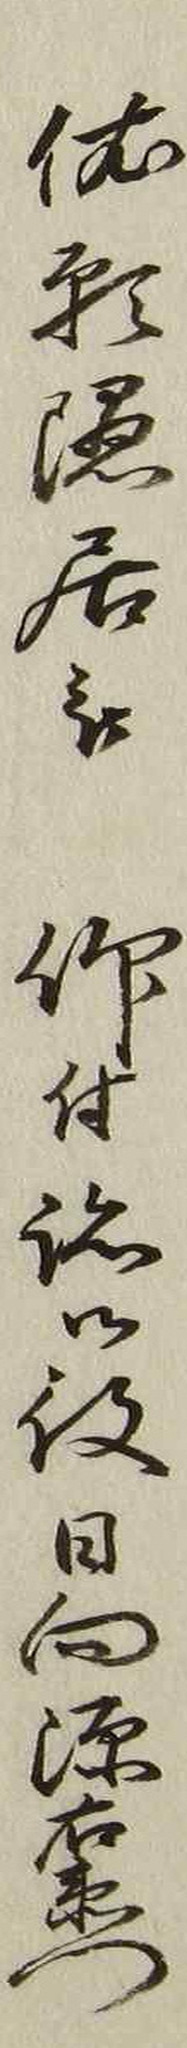依願隠居被仰付跡御役日向源右衛門
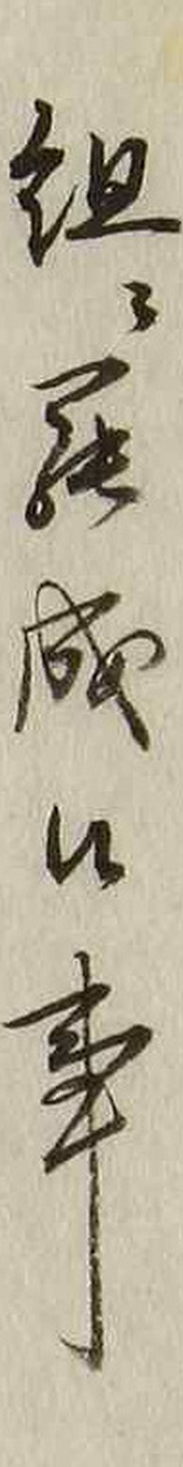組罷成候事
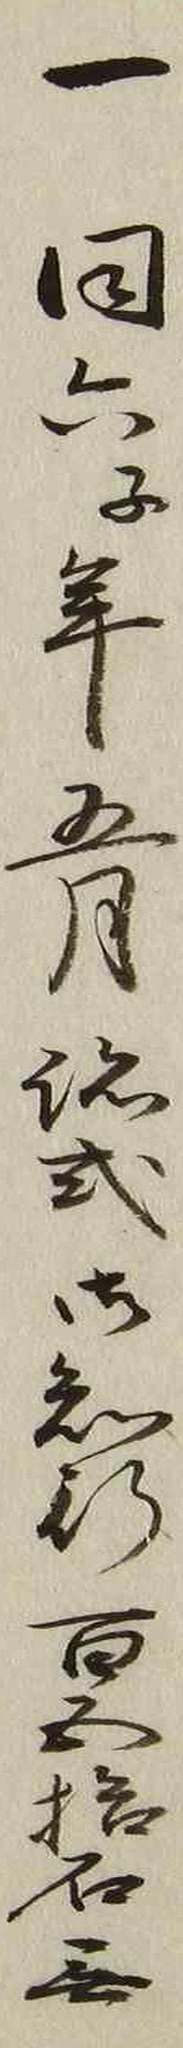一同六子年五月跡式御知行百五拾石無
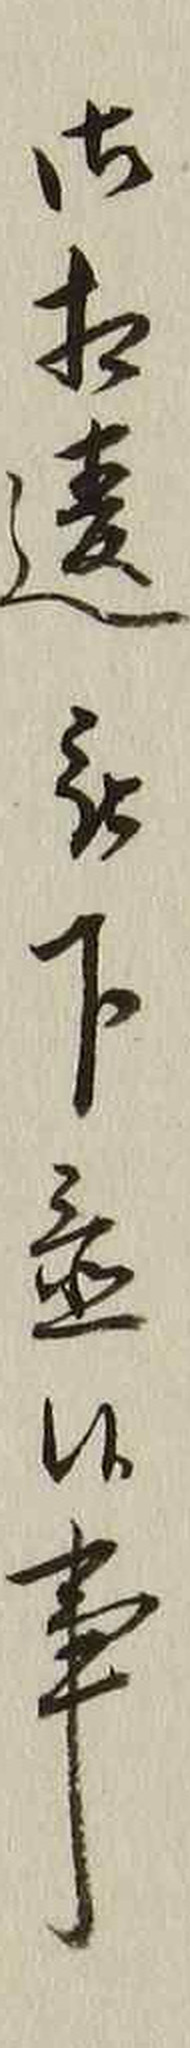御相違被下置候事
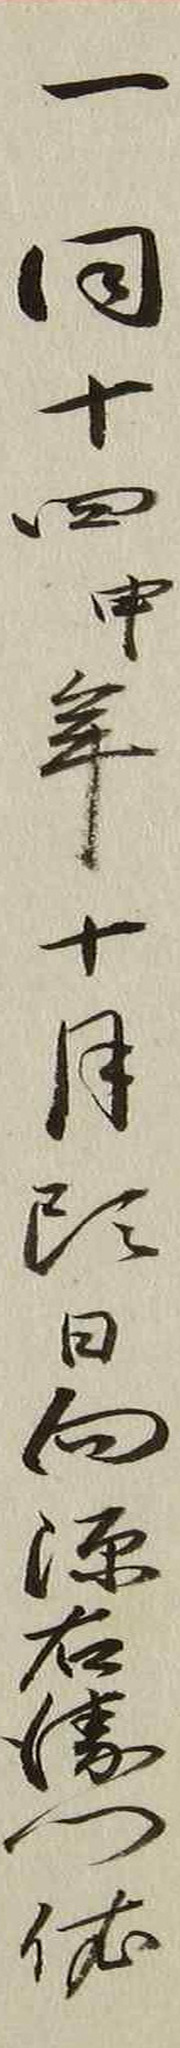一同十四申年十月頭日向源右衛門依
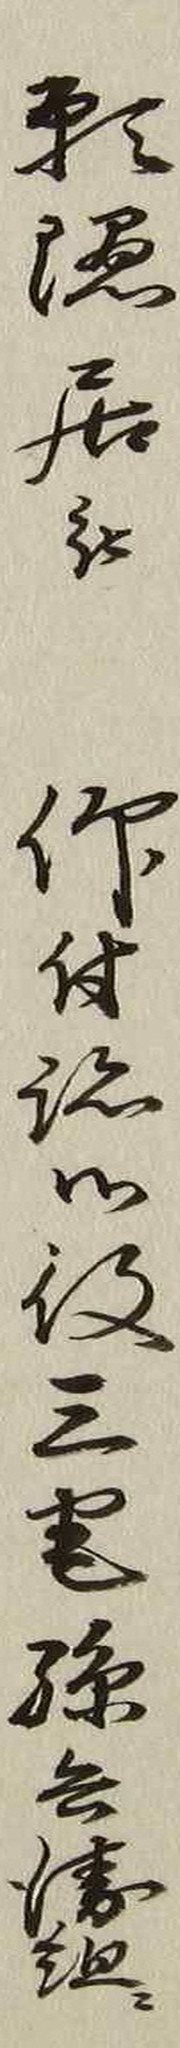願隠居被仰付跡御役三宅孫兵衛組ニ
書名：諸士系譜　巻之149　そ之部2
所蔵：会津若松市立会津図書館
